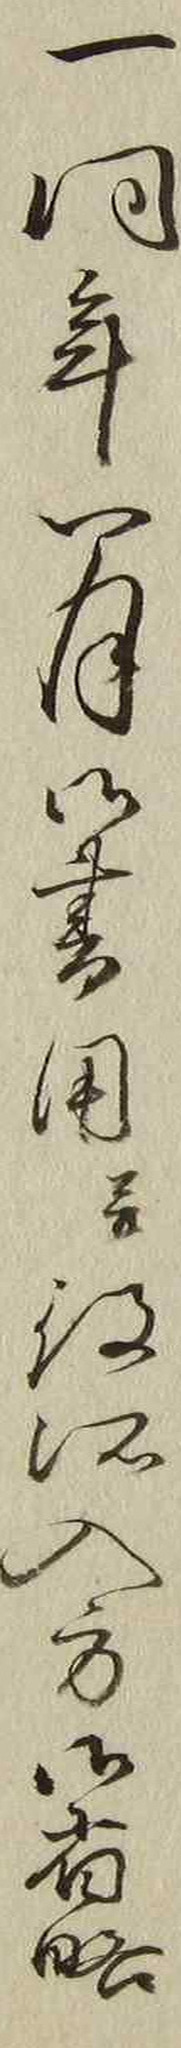一同年八月御書用并役所入方御省略
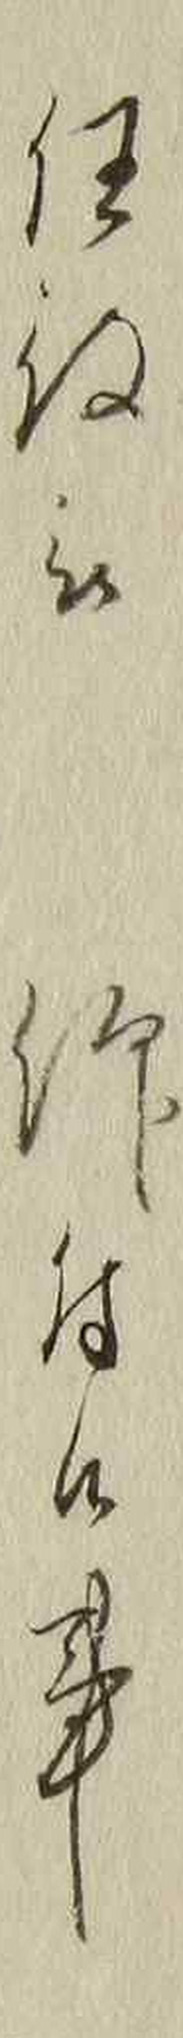任役被仰付候事
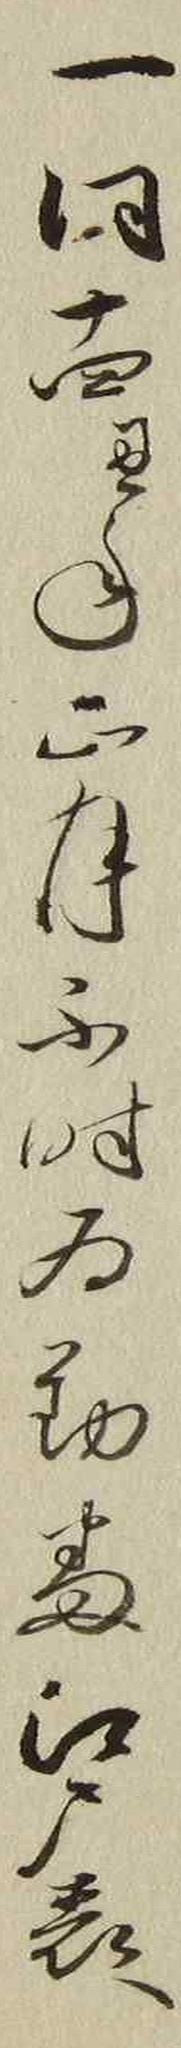一同十四丑年正月不時為勤番江戸表へ
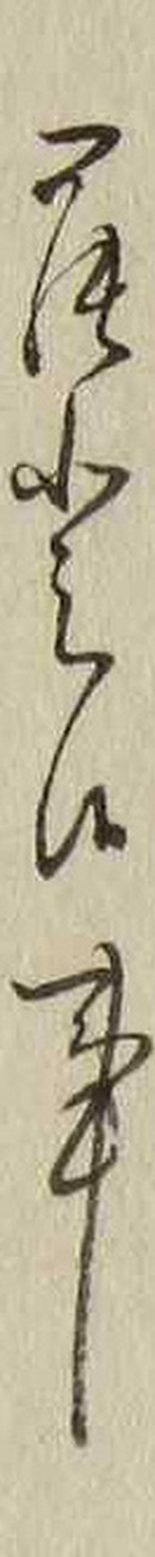罷登候事
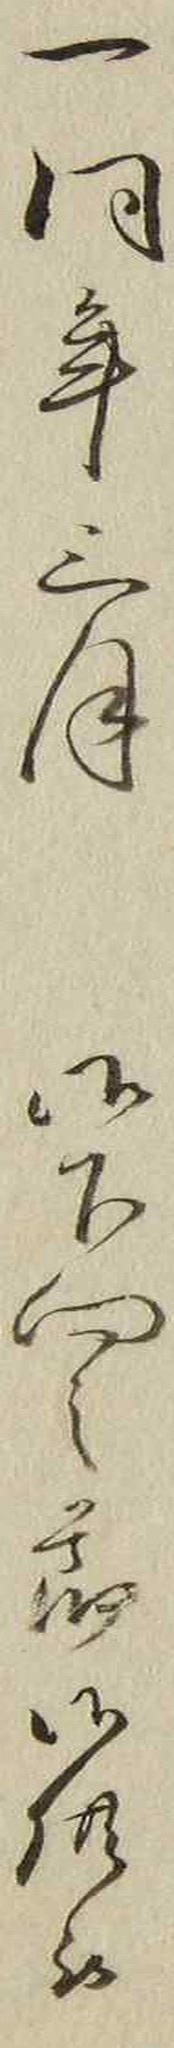一同年三月御下向之節御供被
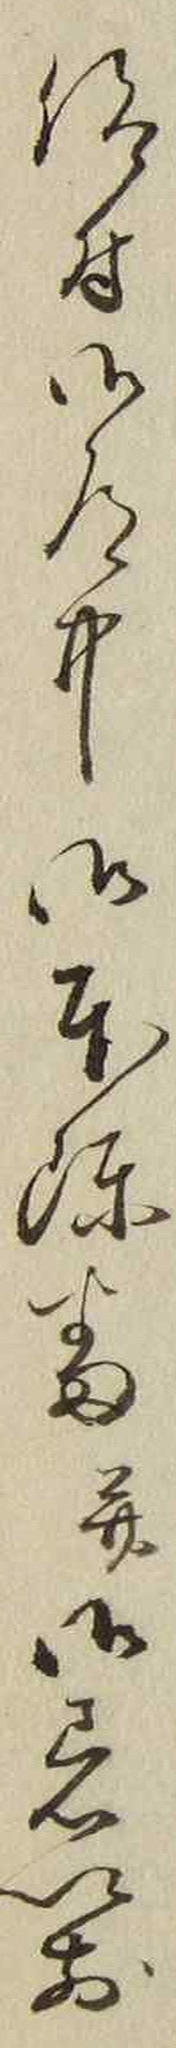仰付御道中御本陣番并御着以前

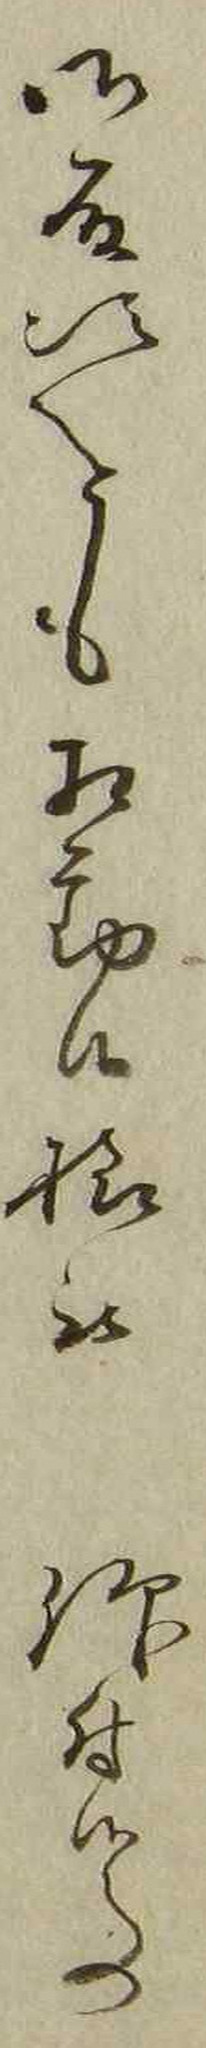御取次をも相勤候様被仰付候事
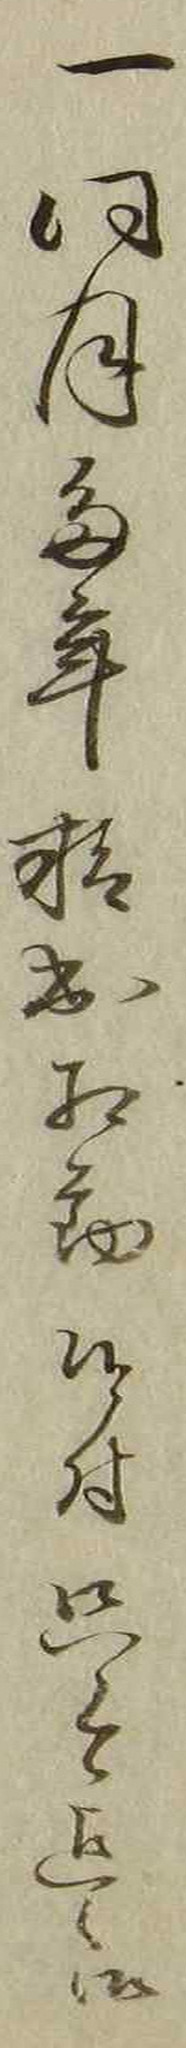一同月多年精出相勤候ニ付只今迄之御
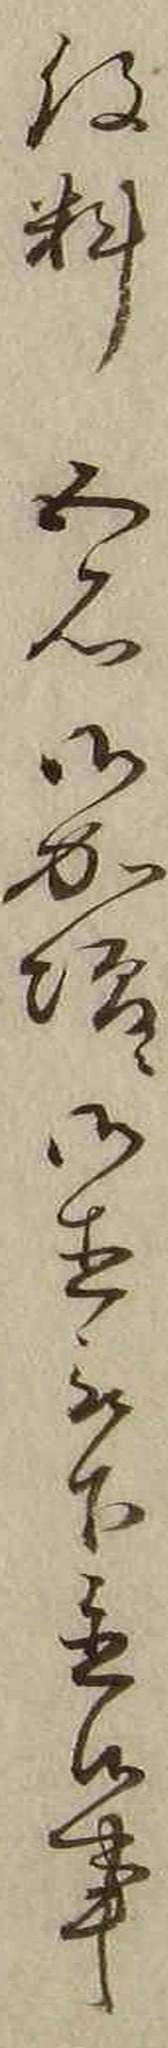役料五石御加増ニ御直被下置候事
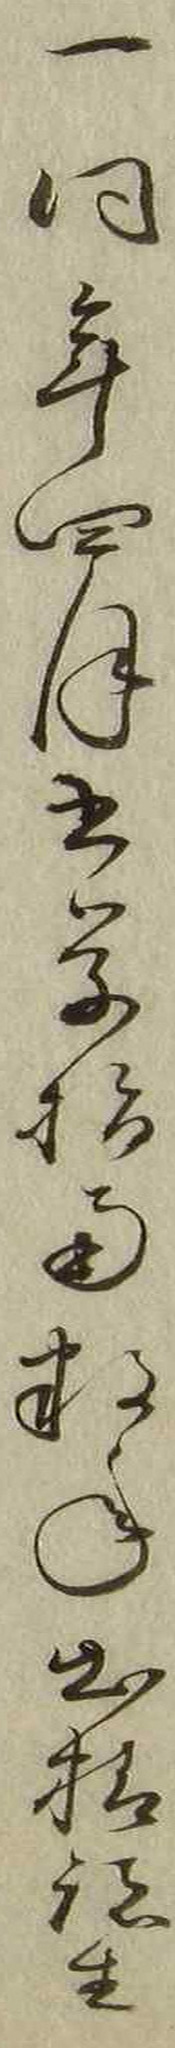一同年四月書学指南数年出精諸生
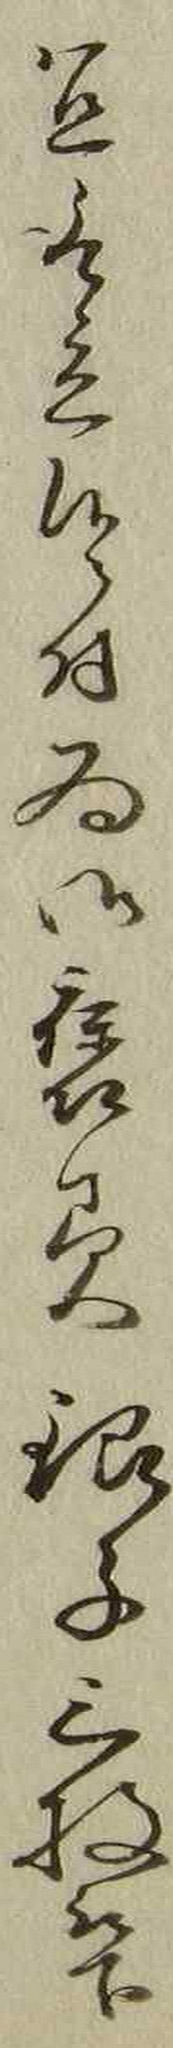宜取立候ニ付為御褒美銀子三枚被下
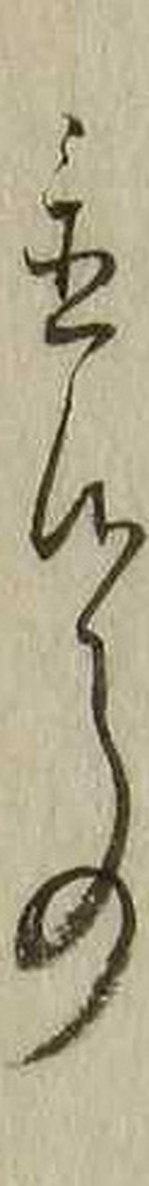置候事
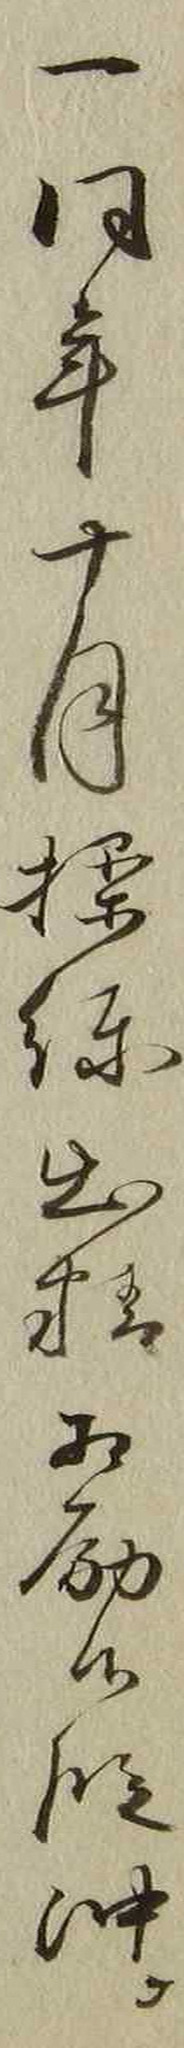一同年十月操練出精相励候段仲ケ
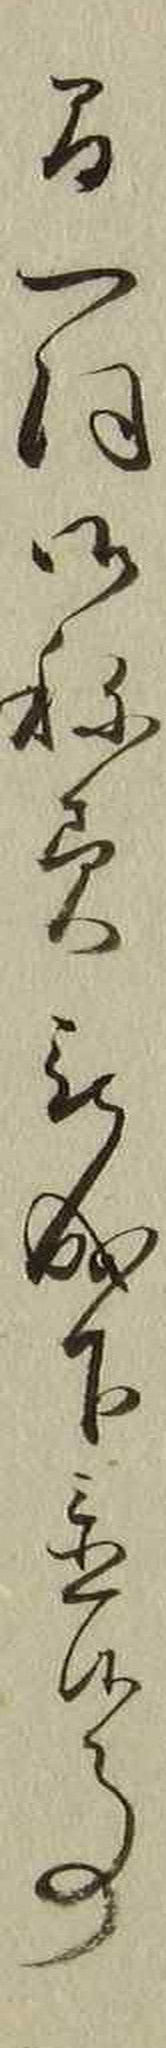間一同御称美被成下置候事
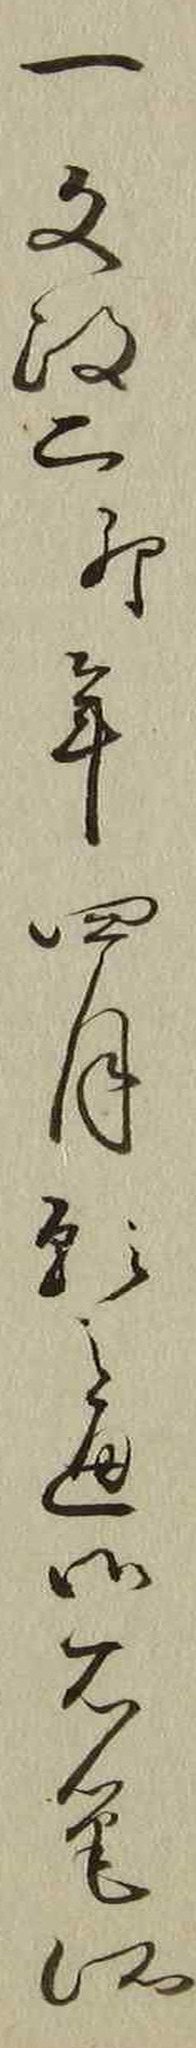一文政二卯年四月願之通御右筆所
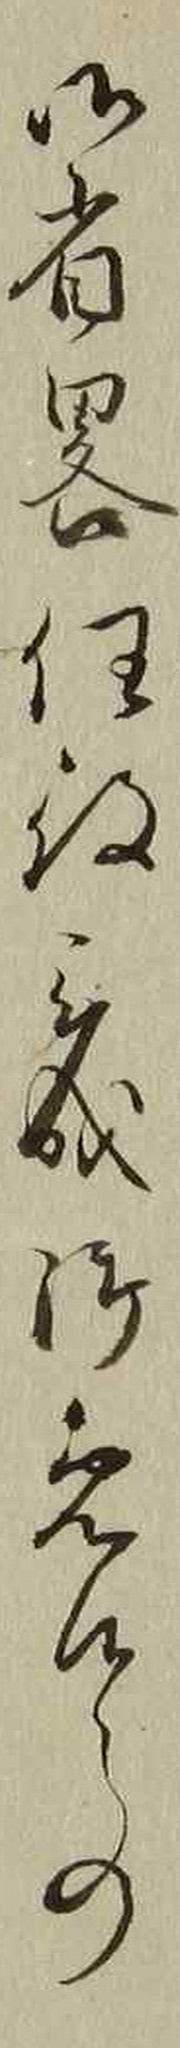御省略任役被成御免候事
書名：諸士系譜　巻之4　い之部4
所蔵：会津若松市立会津図書館
